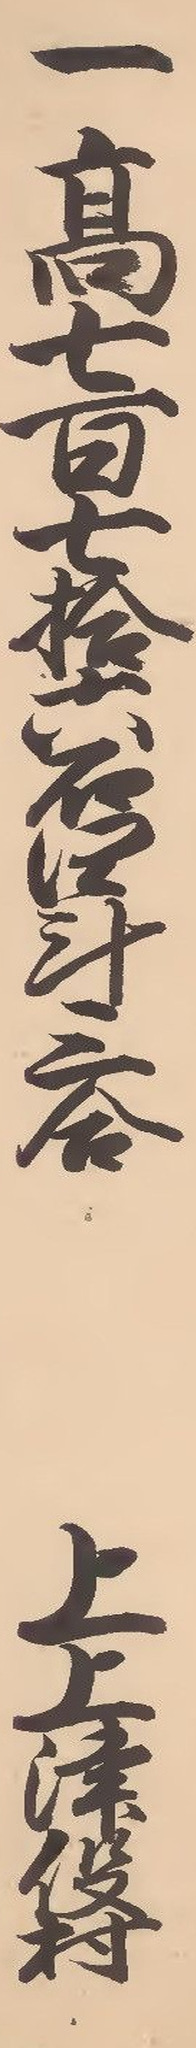一高七百七拾六石四斗三合上上津役村
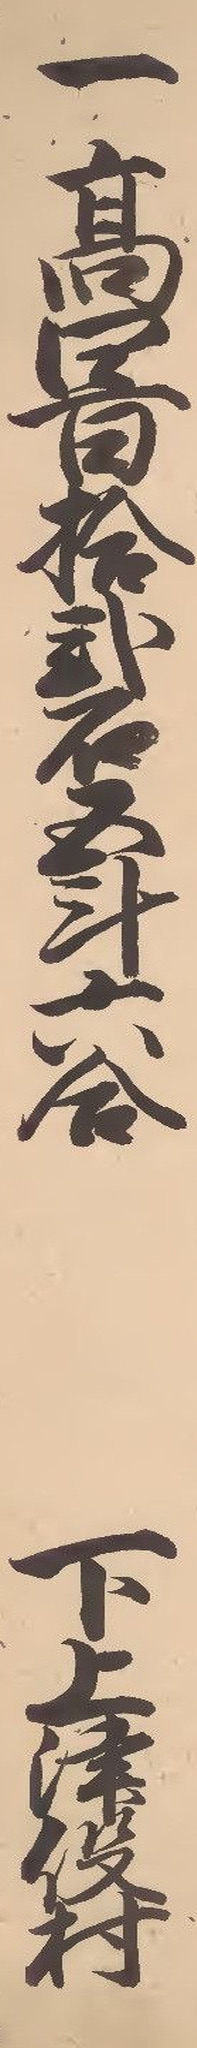一高四百拾弐石五斗六合下上津役村

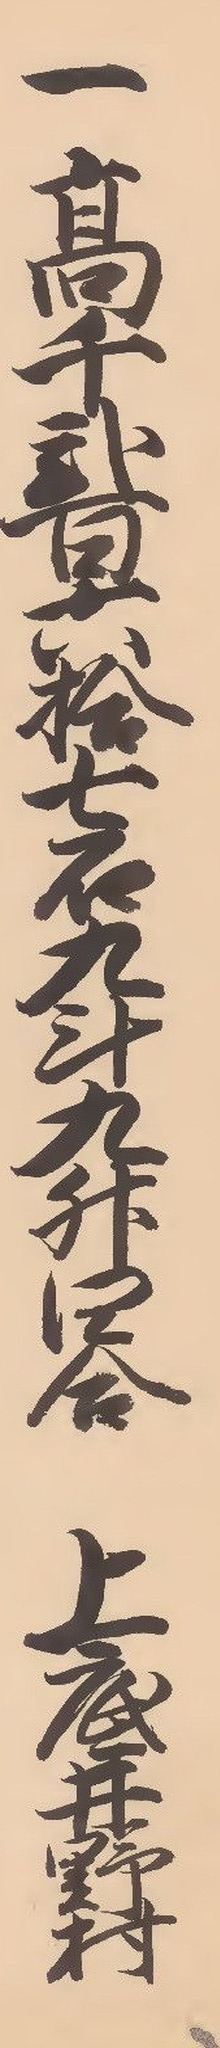一高千弐百六拾七石九斗九升四合上底井野村
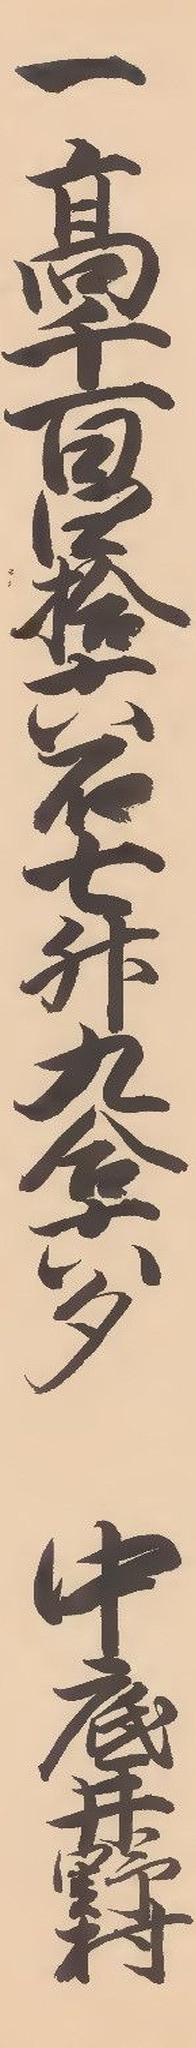一高千百四拾六石七升九合六勺中底井野村
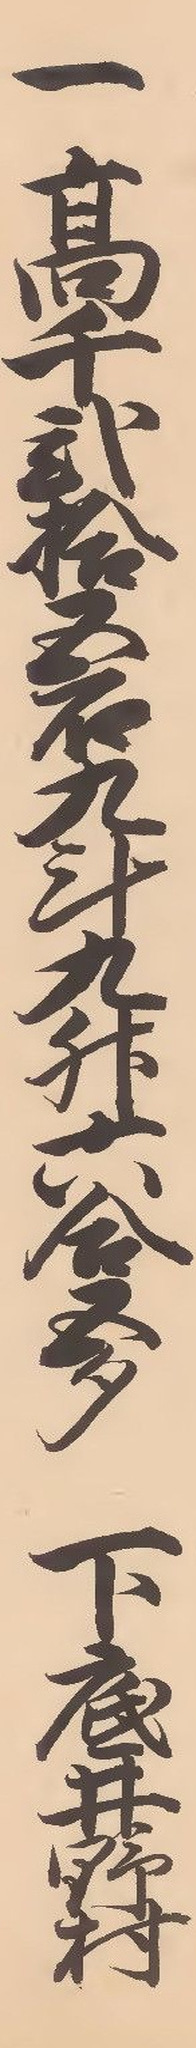一高千弐拾五石九斗九升六合五勺下底井野村
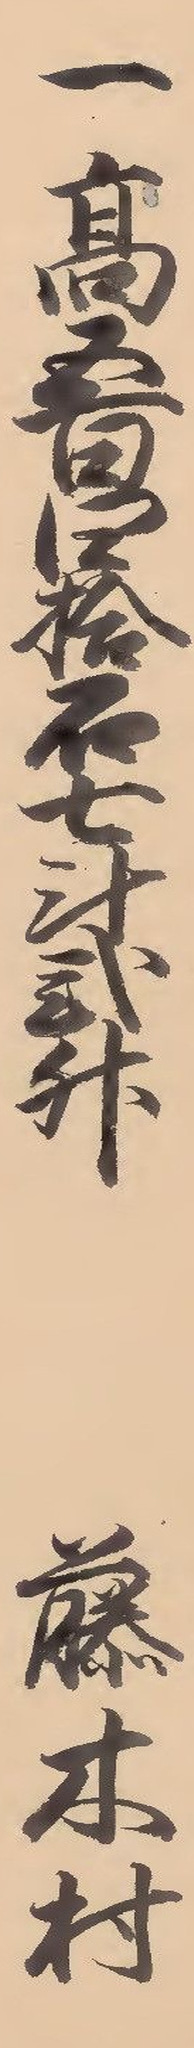一高五百四拾石七斗弐升藤木村
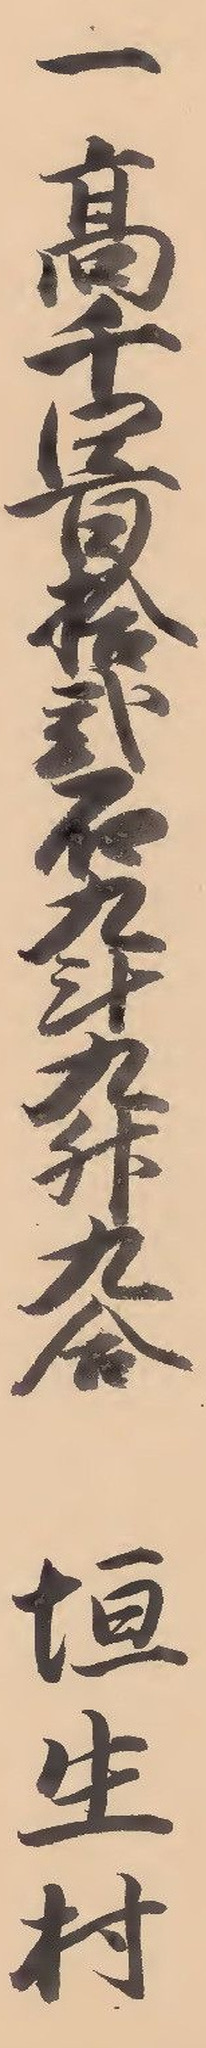一高千四百拾弐石九斗九升九合垣生村
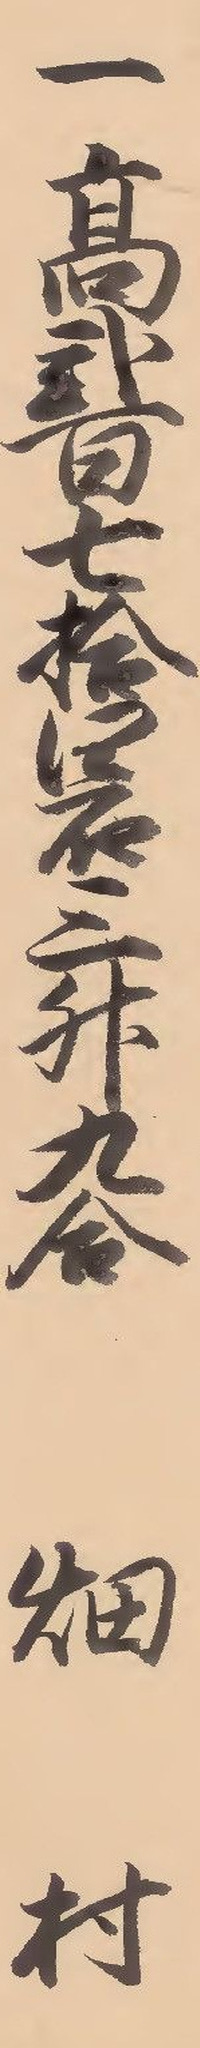一高弐百七拾四石三升九合畑村
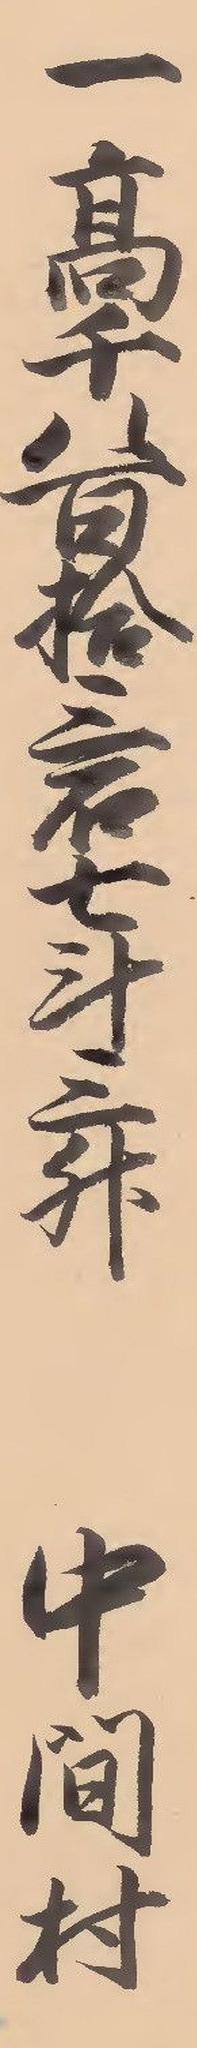一高千八百拾三石七斗三升中間村

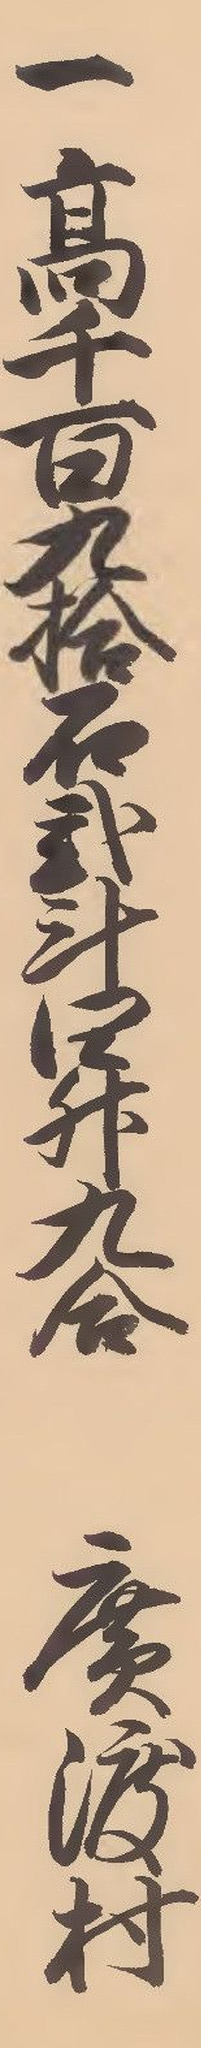一高千百九拾石弐斗四升九合広渡村
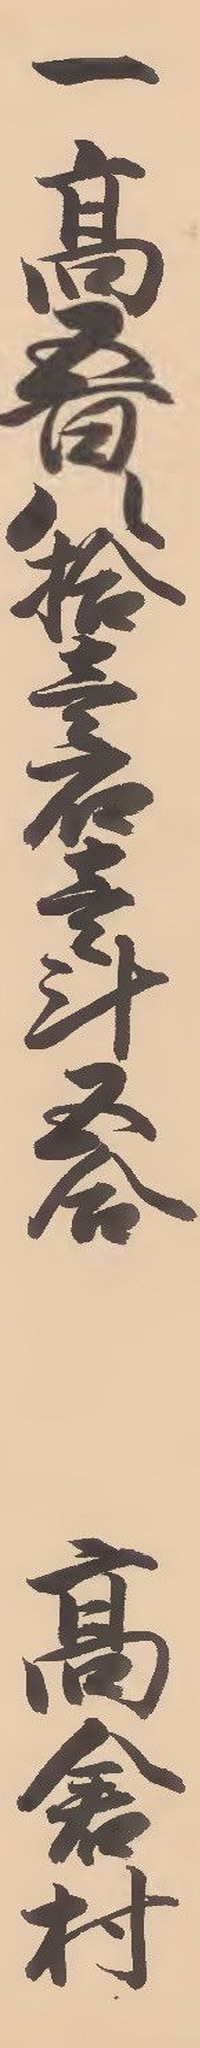一高五百八拾壱石壱斗五合高倉村
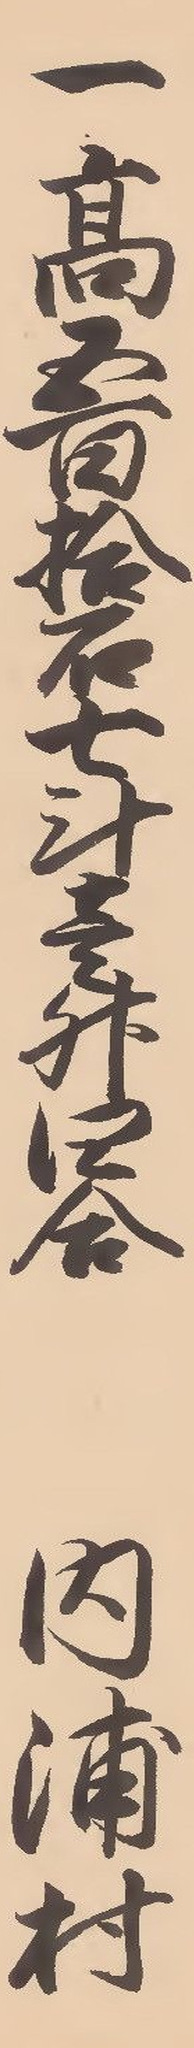一高五百拾石七斗壱升四合内浦村
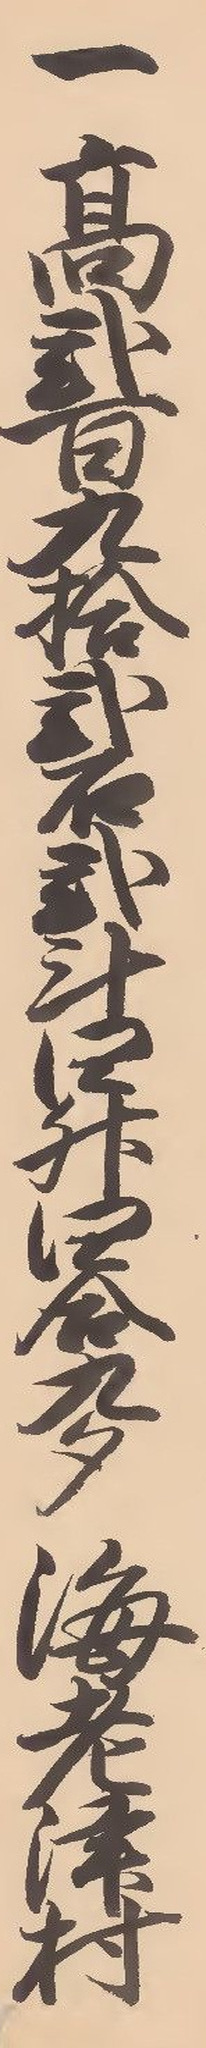一高弐百九拾弐石弐斗四升四合九勺海老津村

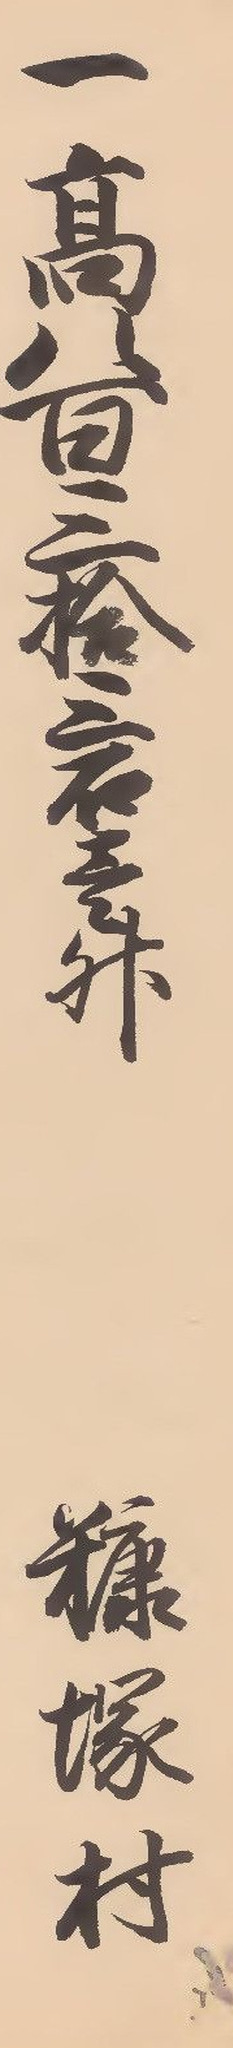一高八百三拾三石壱升糠塚村
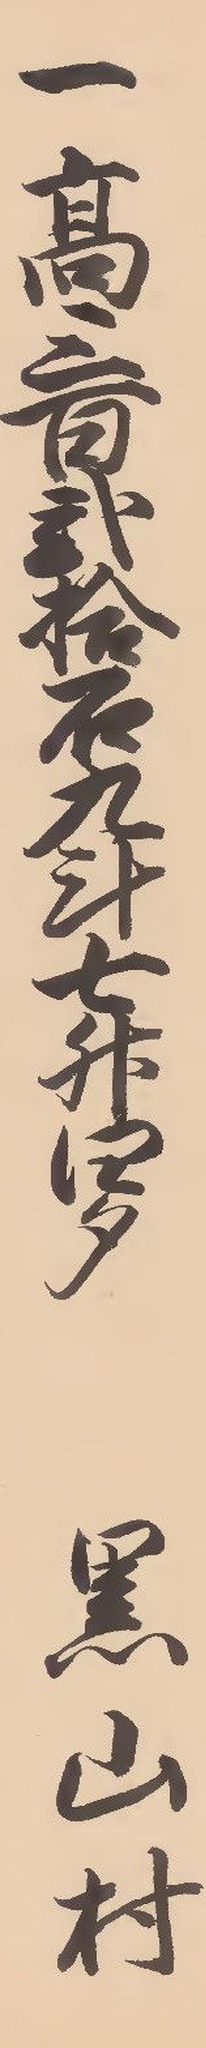一高三百弐拾石九斗七升四勺黒山村
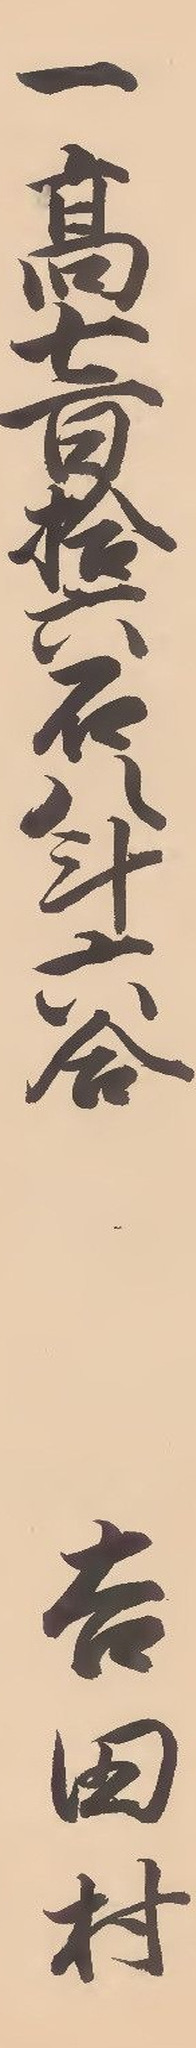一高七百拾六石八斗六合吉田村
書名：筑前国郷帳
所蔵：国立公文書館 National Archives of Japan
